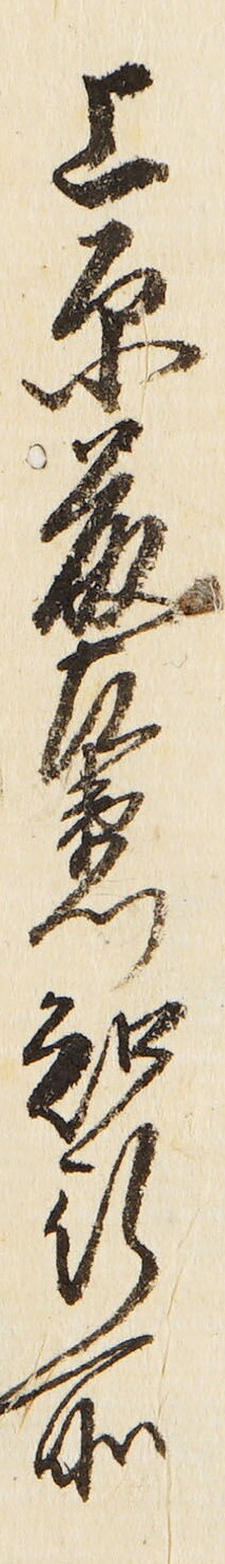上原藤左衛門知行所
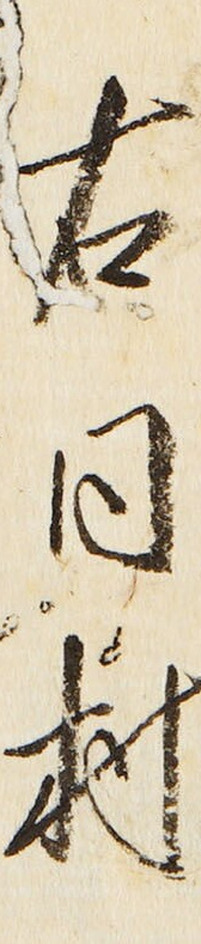右同村

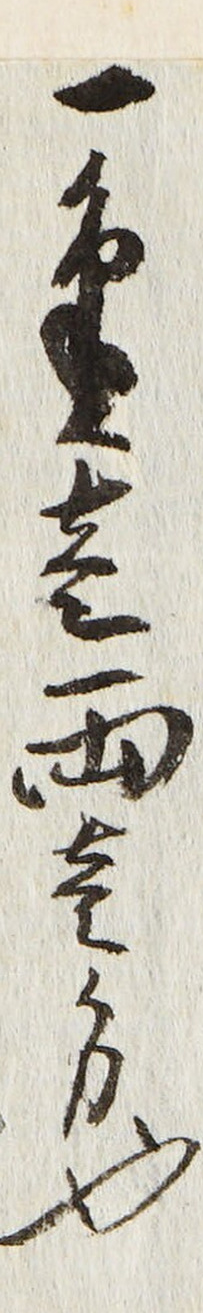一金壱両壱分也
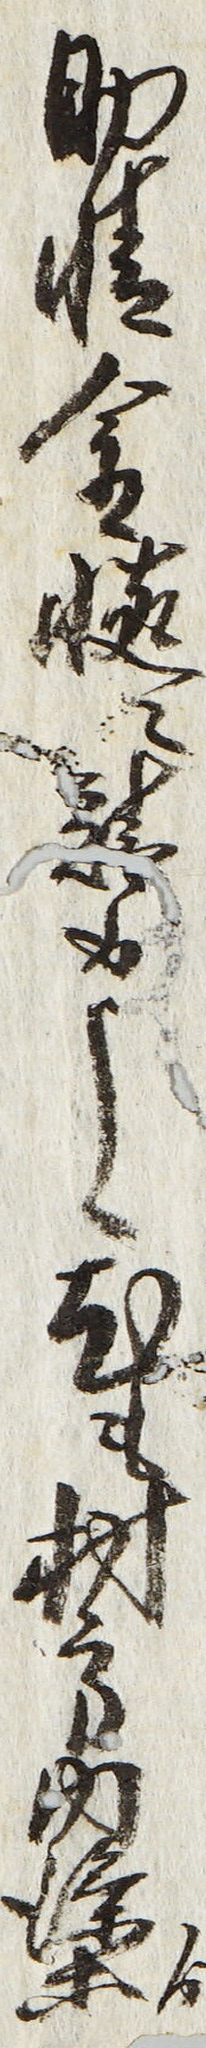助情金慥ニ請取申候尤も村方内済等
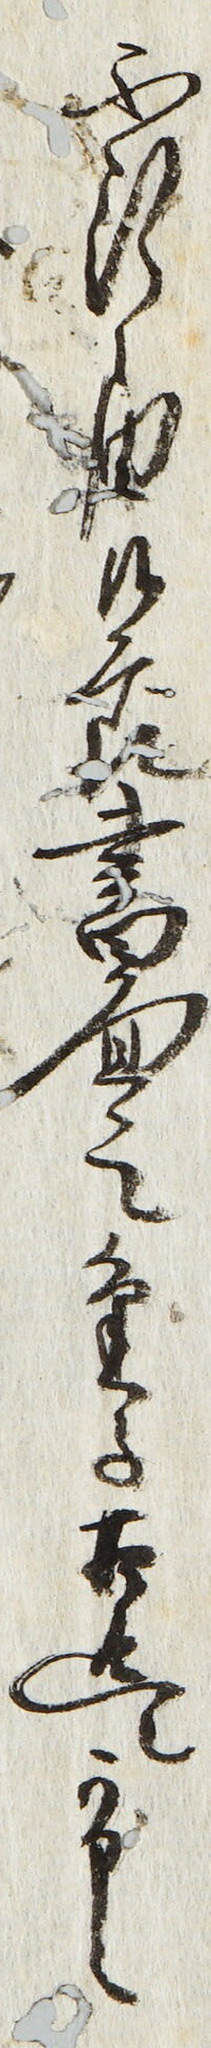不行届候節書面之金子相返し可申候
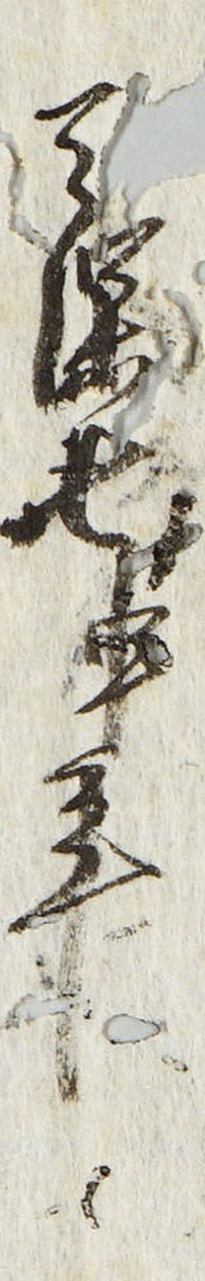天保七申年
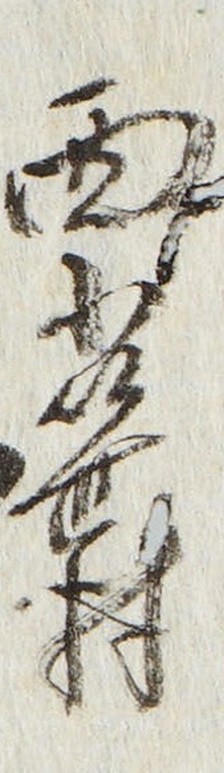西小笹村
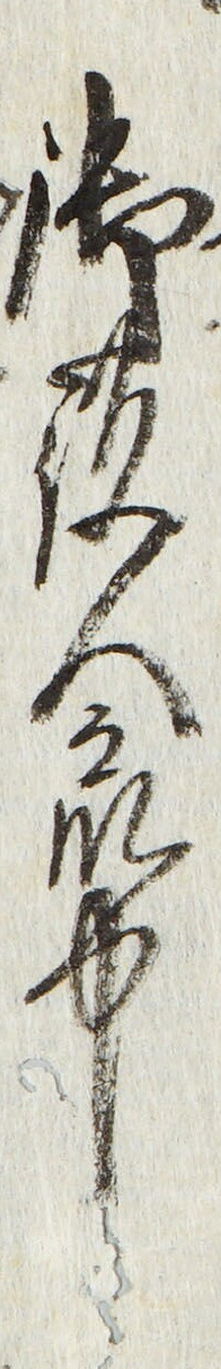御役人衆中

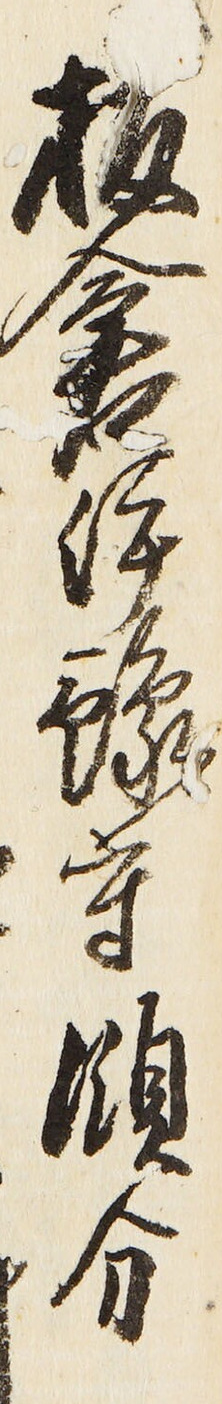板倉伊予守領分
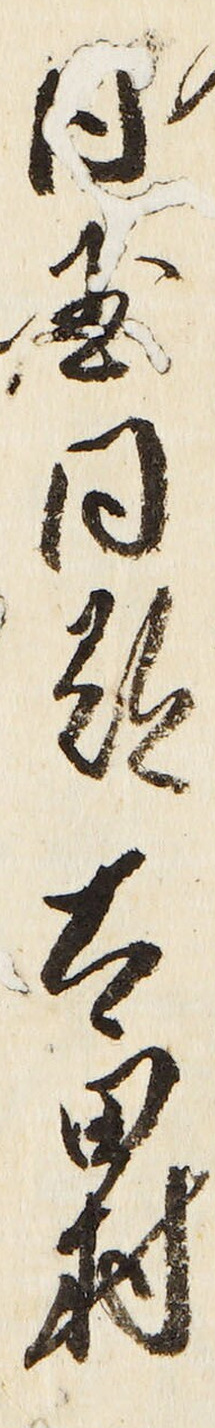同国同領太田村
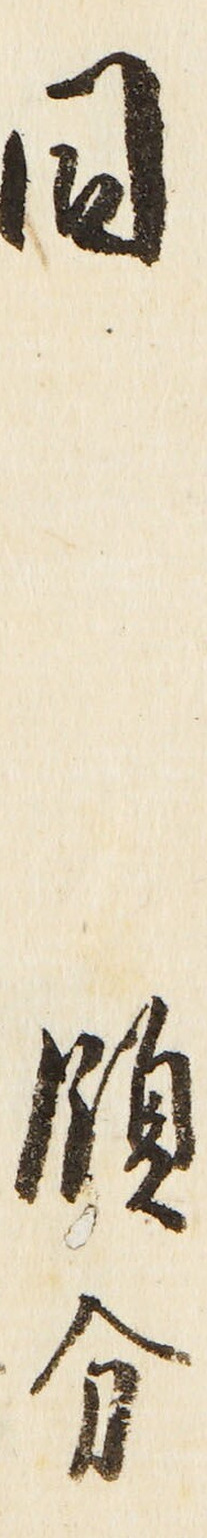同領分
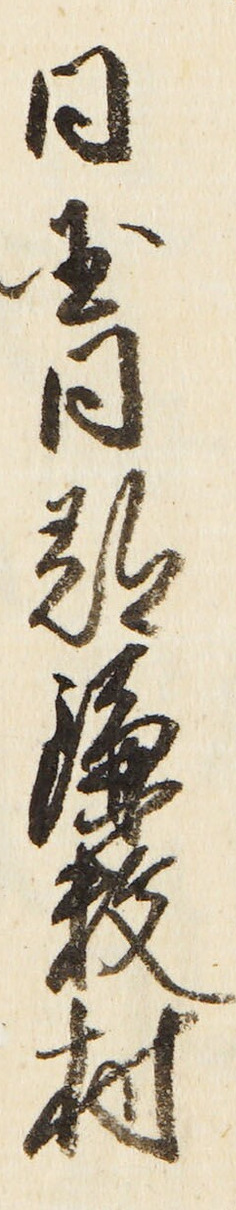同国同領鎌数村

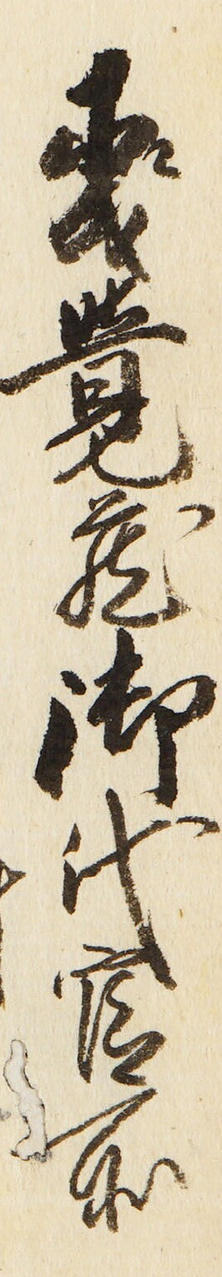森覚蔵御代官所
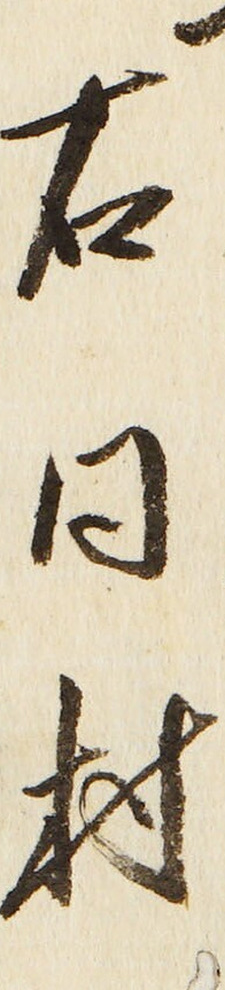右同村
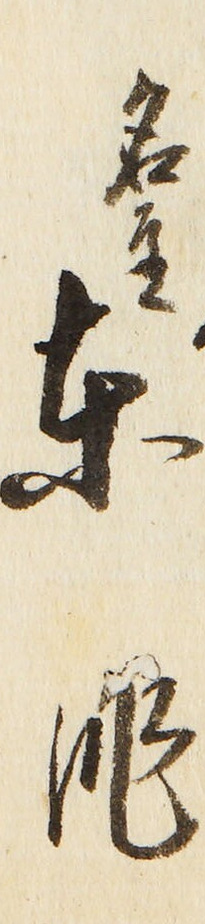名主東作
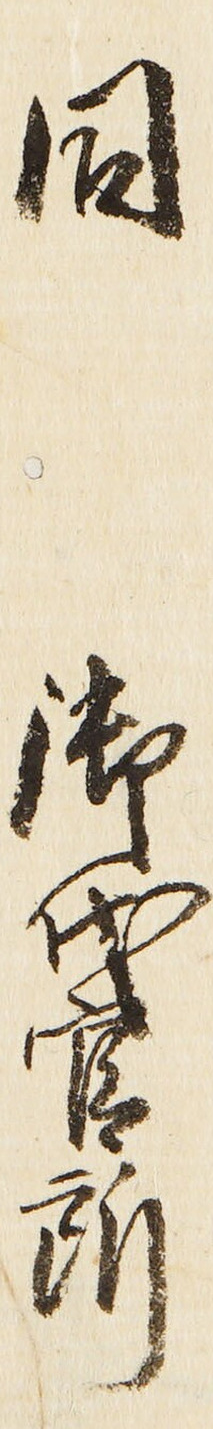同御代官所
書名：難船一件記録
